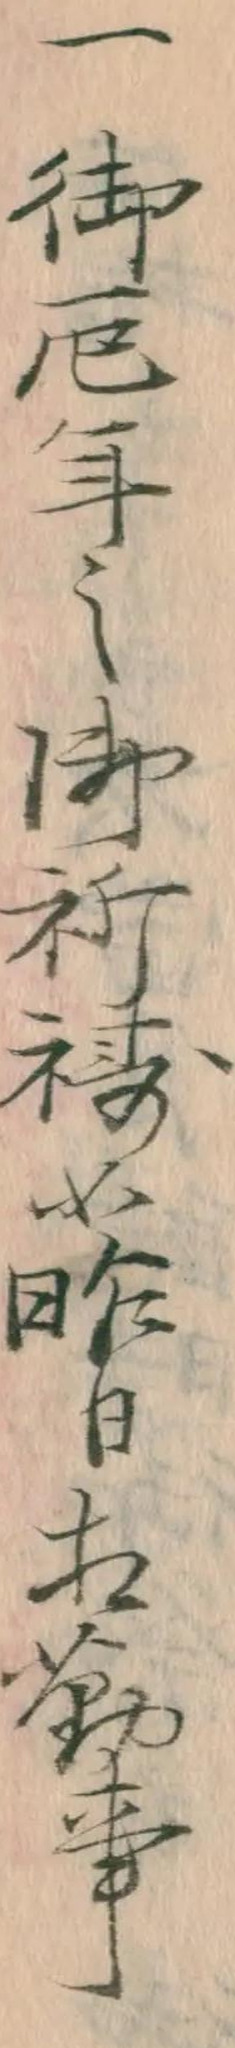一御厄年之御祈祷如昨日相勤事
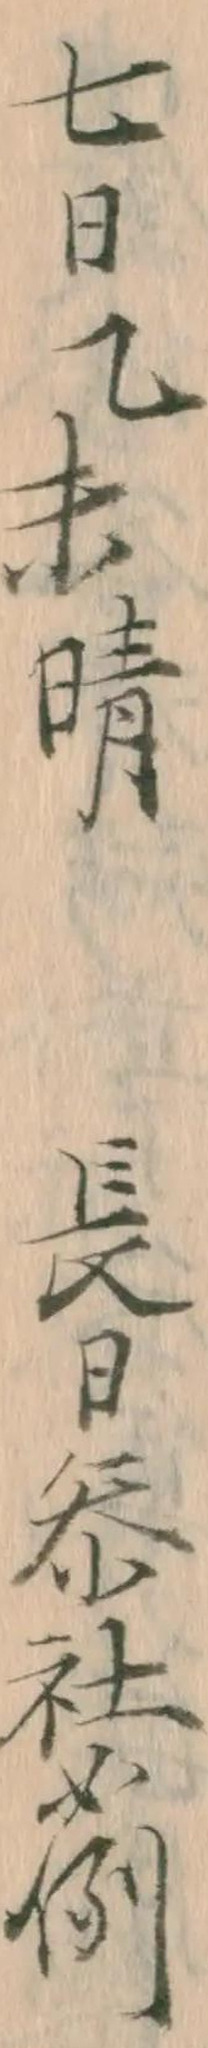七日乙未晴長日参社如例
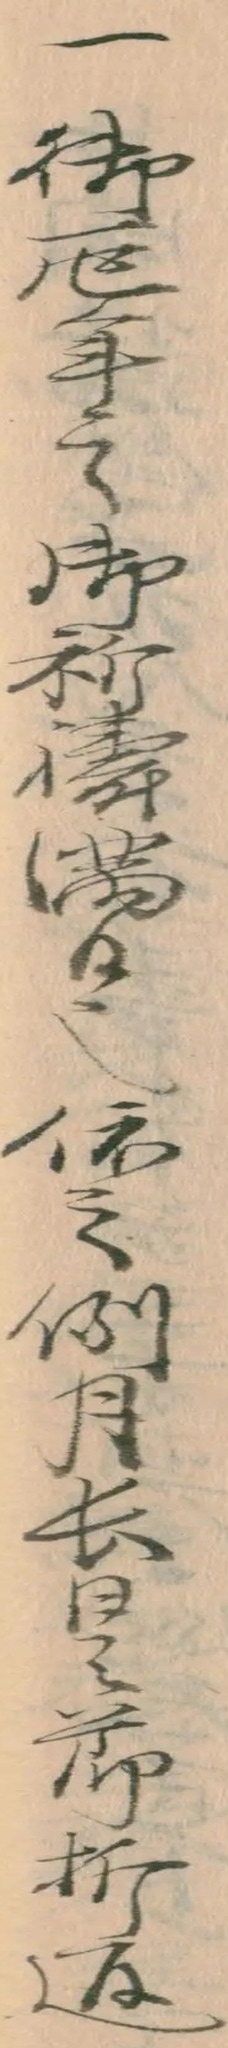一御厄年之御祈祷満日也依之例月長日之節折返
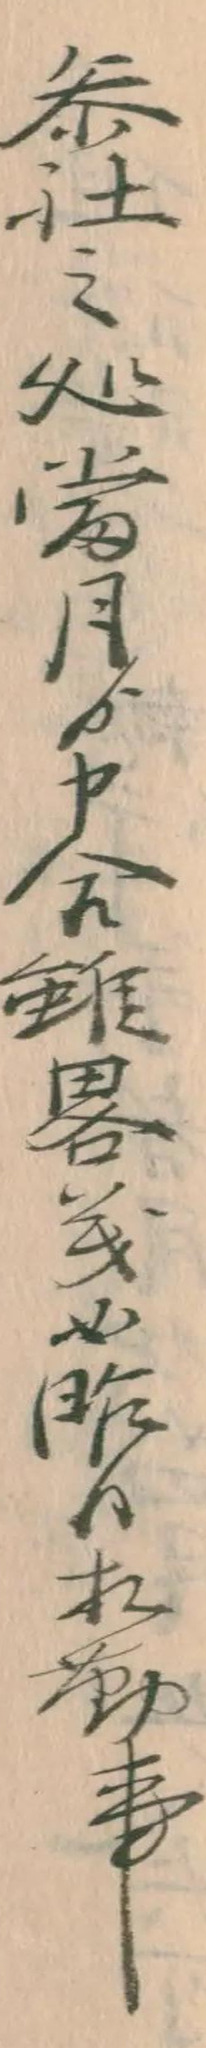参社之処當月ゟ申合誰畧義如昨日相勤事
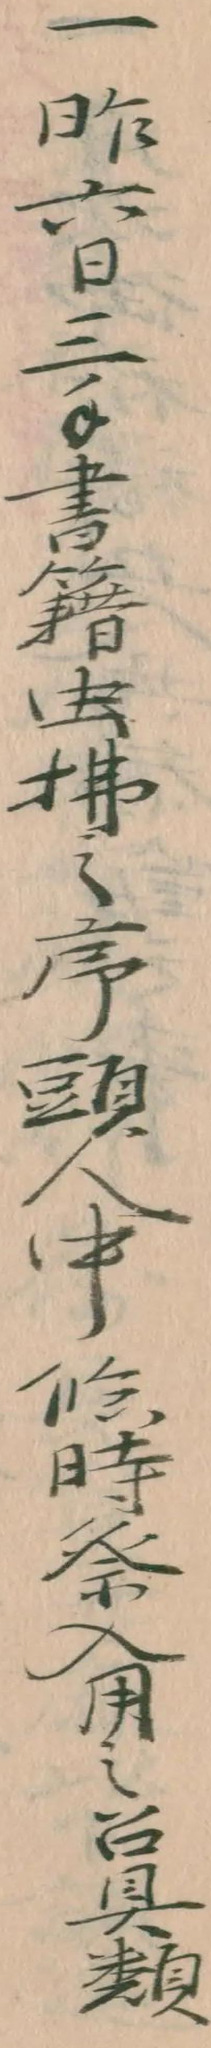一昨六日三手書籍虫払之序頭人中臨時祭入用之召具類
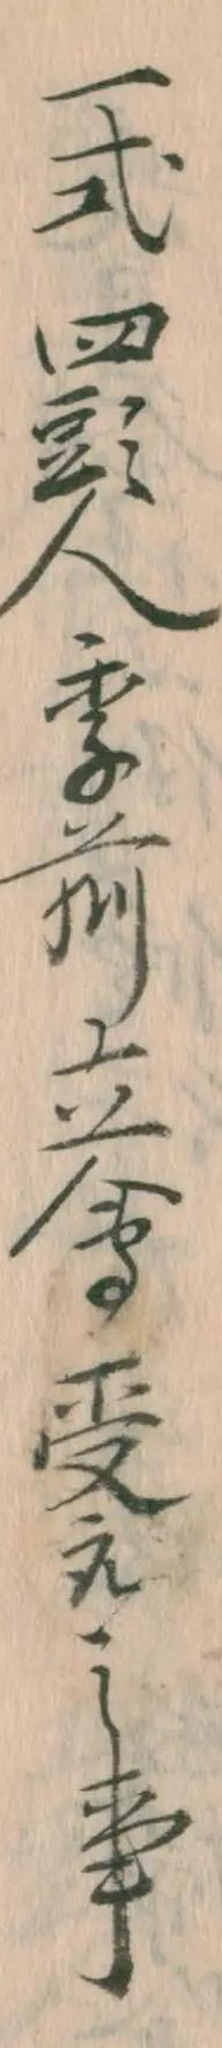一式四頭人季前立會受取之事
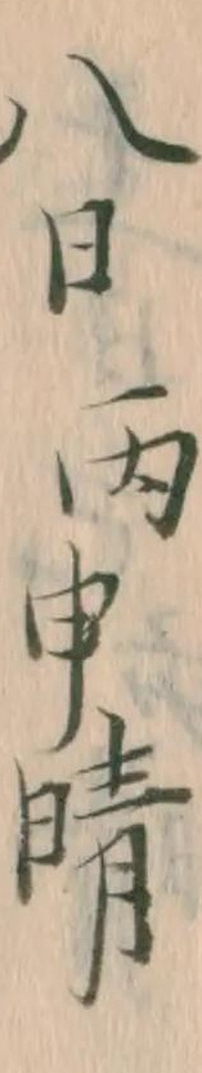八日丙申晴
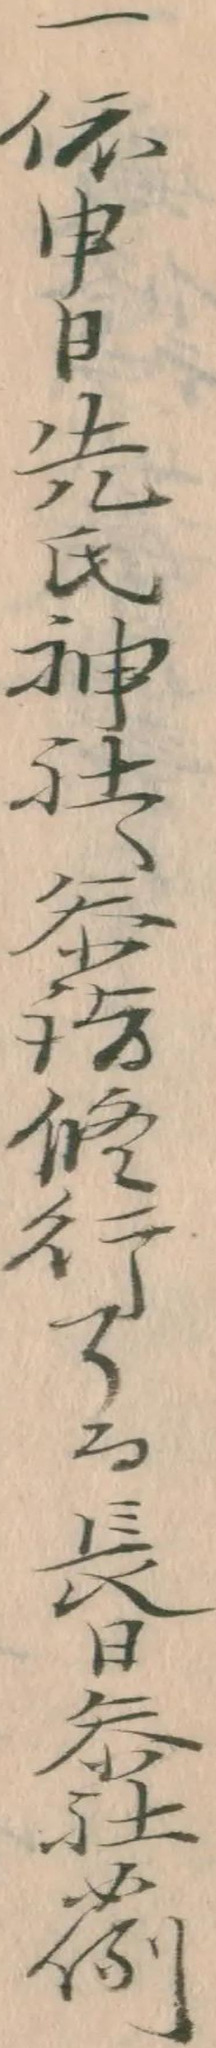一依申日先氏神社へ参詣修行了而長日参社如例
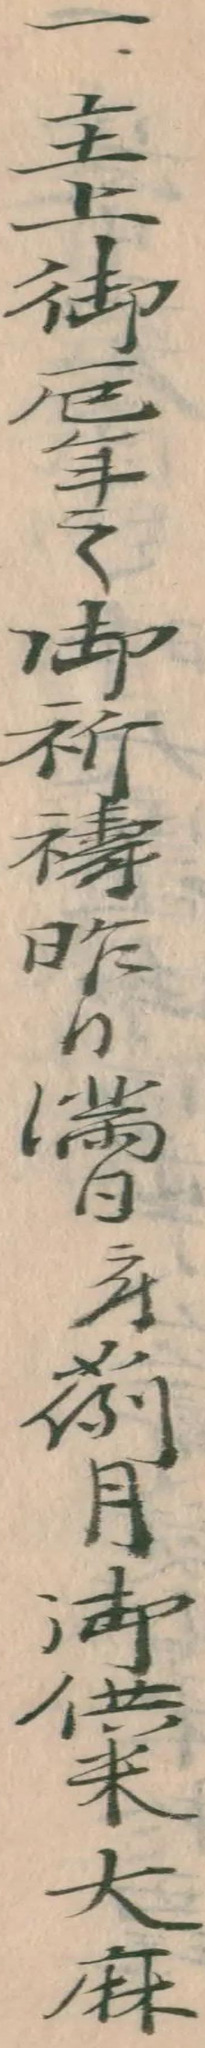一主上御厄年之御祈祷昨日満日ニ付如例月御供米大麻
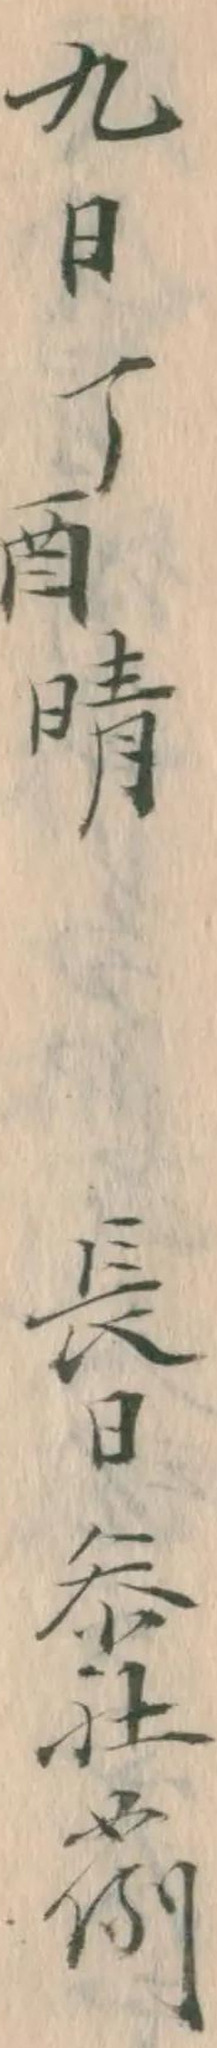九日丁酉晴長日参社如例
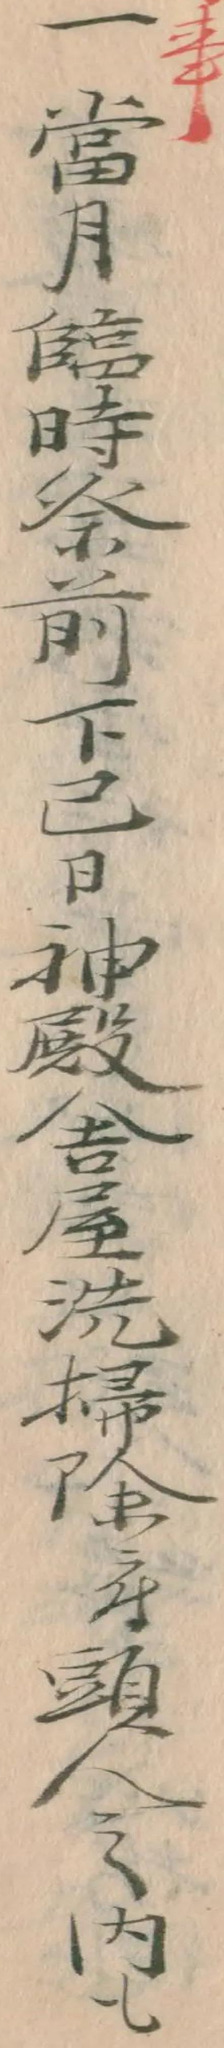一當月臨時祭前下己日神殿舎屋洗掃除ニ付頭人之内も
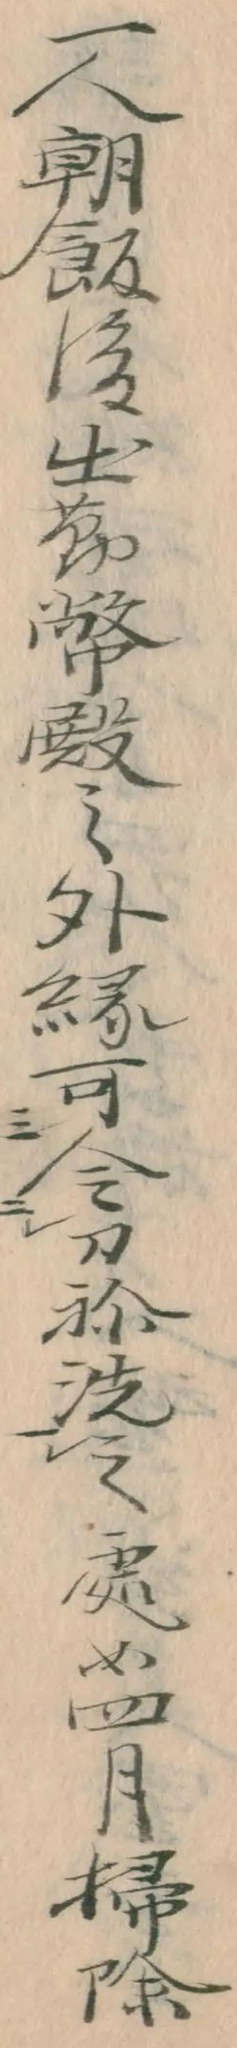一人朝飯後出勤幣殿之外縁可令刀祢洗之處如四月掃除

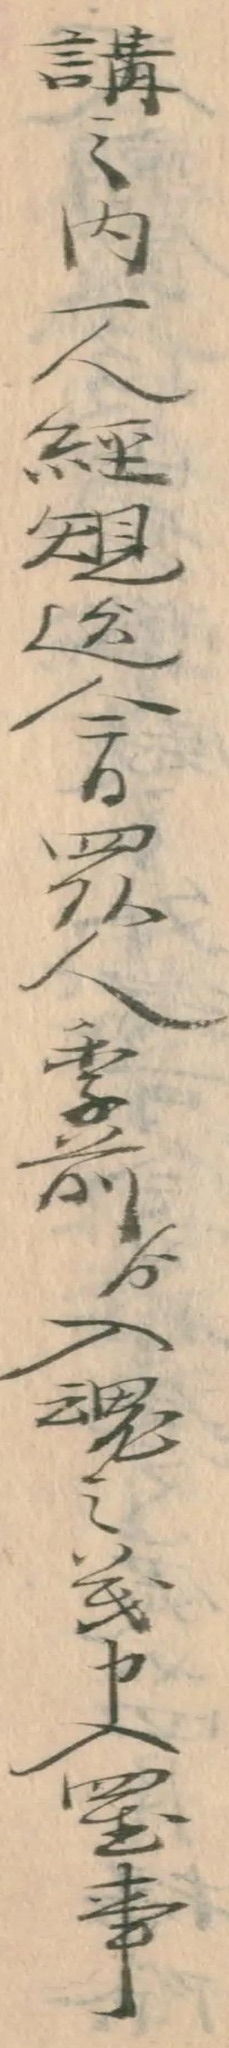講之内一人経規迄今日四頭人季前ゟ入魂之義申入置事
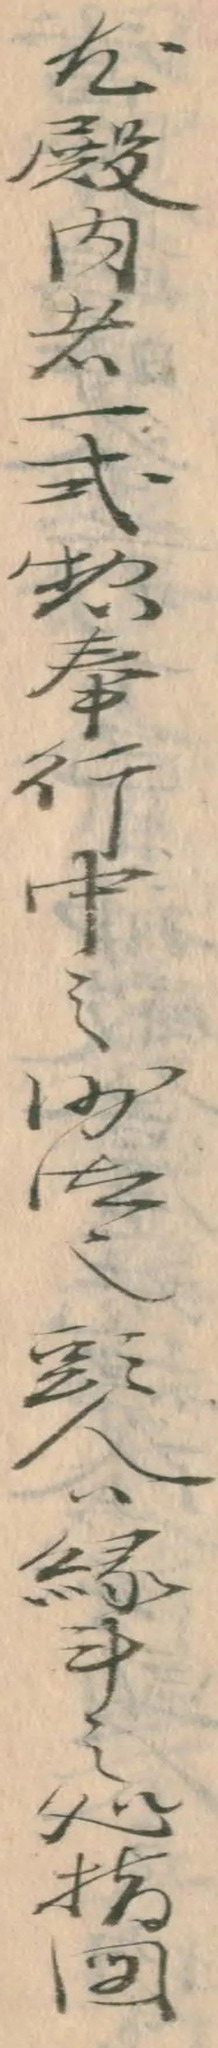尤殿内者一式惣奉行中之沙汰也頭人ハ縁斗之処指図
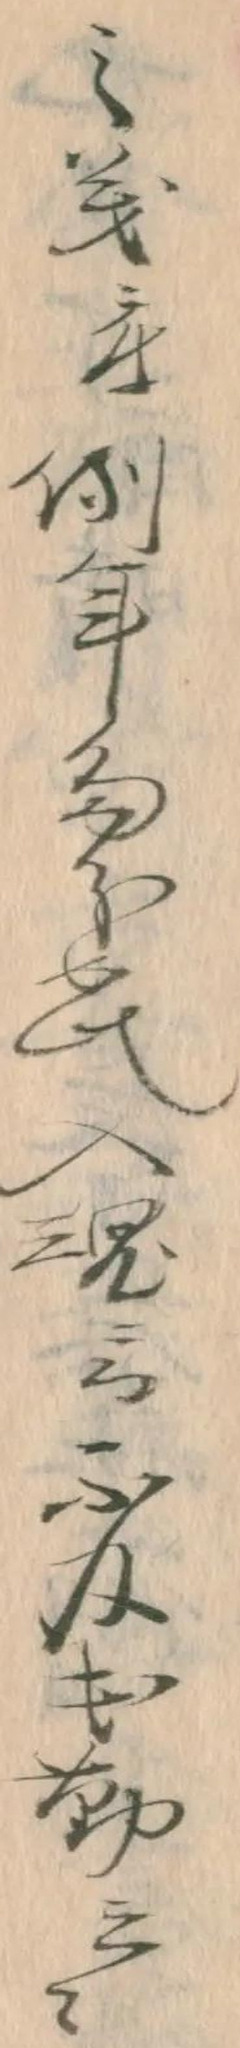之義ニ付例年多分如此入魂ニ而不及出勤云々
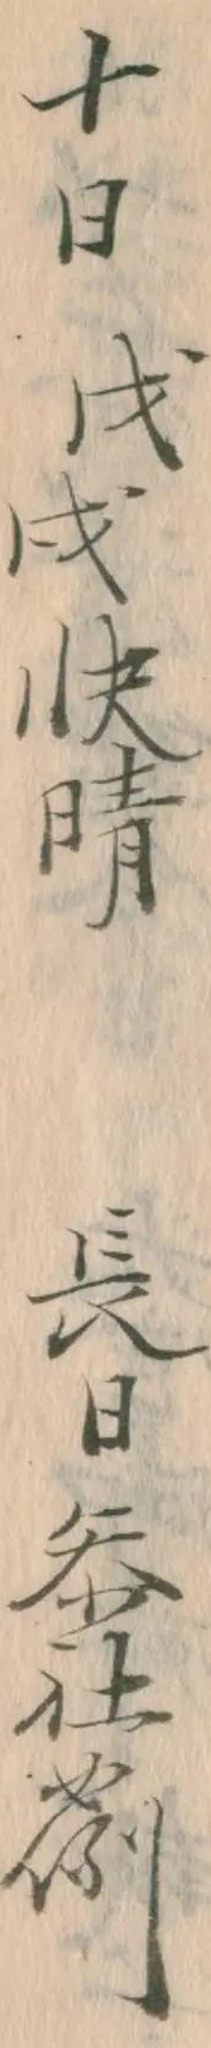十日戊戌快晴長日参社如例
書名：賀茂社記録. 第74冊
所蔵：国立国会図書館 National Diet Library, JAPAN
